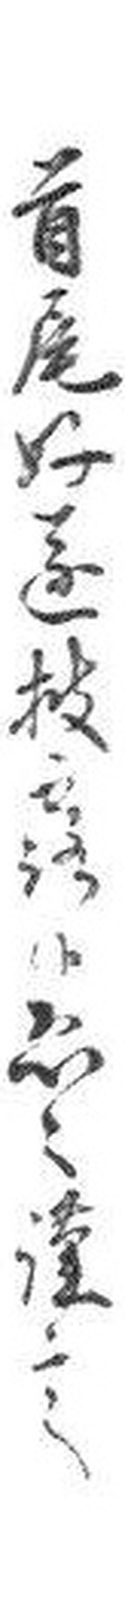首尾好遂披露候恐々謹言
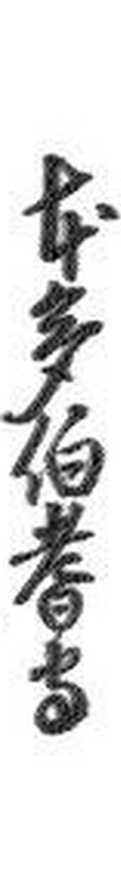本多伯耆守
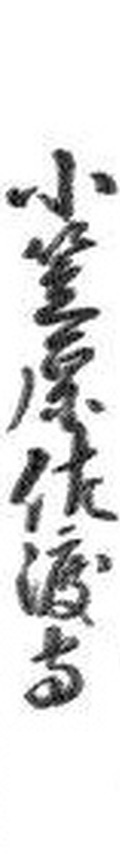小笠原佐渡守
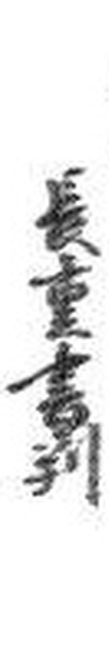長重書判
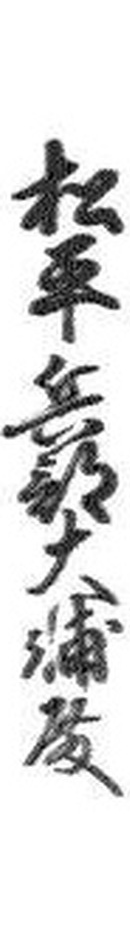松平兵部大輔殿
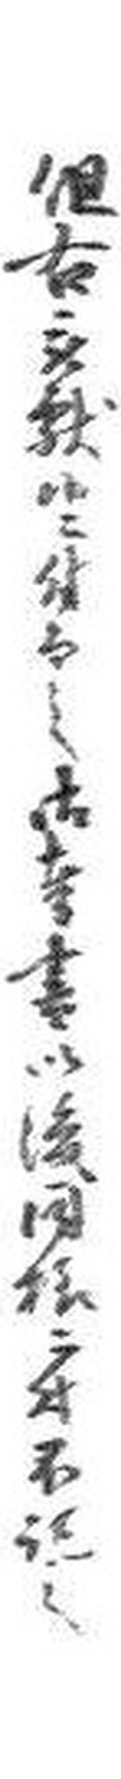但右被献候ニ付而之御奉書以後同様ニ付不記之
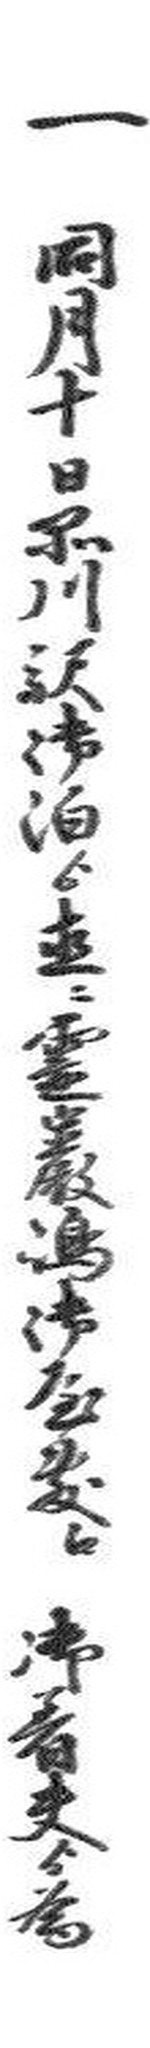一同月十日品川駅御泊ゟ直ニ霊巌嶋御屋敷江御着夫ゟ為
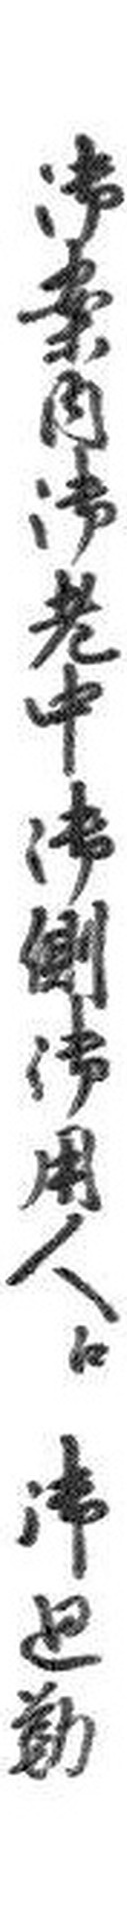御案内御老中御側御用人江御廻勤
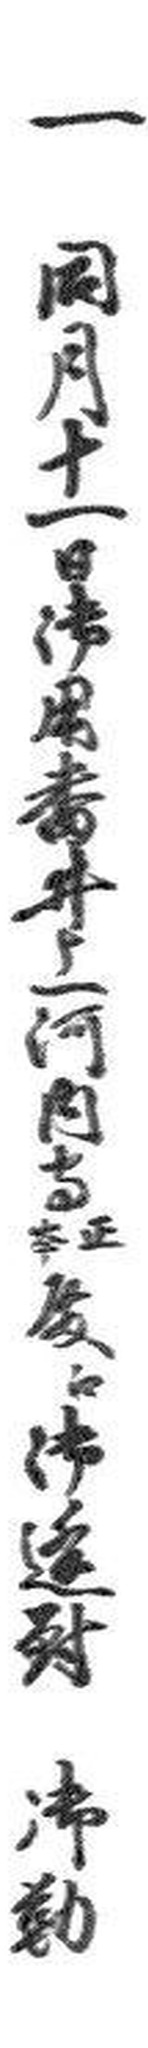一同月十一日御用番井上河内守正岑殿江御逢対御勤
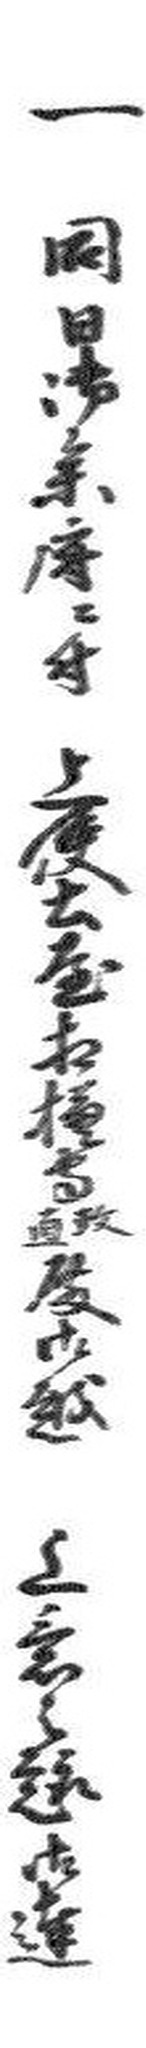一同日御参府ニ付上使土屋相模守政直殿御越上意之趣御達

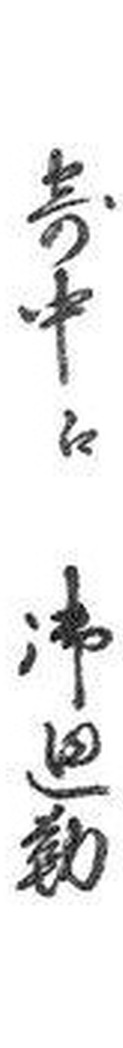寄中江御廻勤
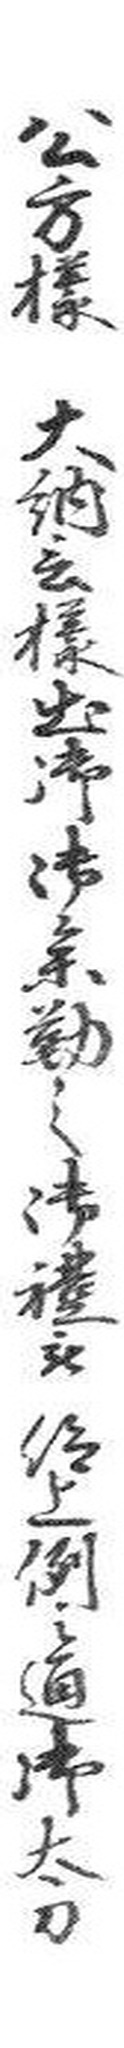公方様大納言様出御御参勤之御礼被仰上例之通御太刀
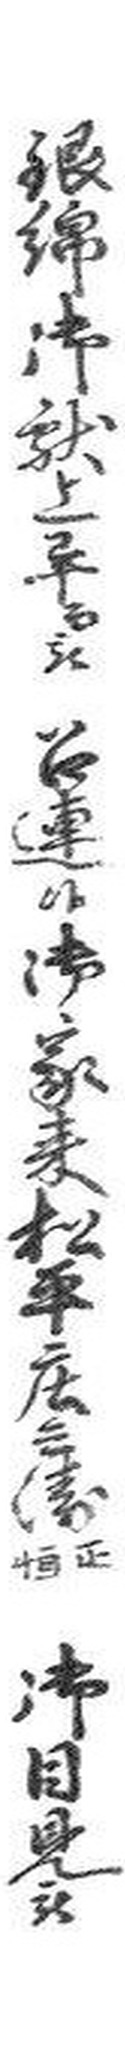銀綿御献上畢而被召連候御家来松平庄兵衛正恒御目見被
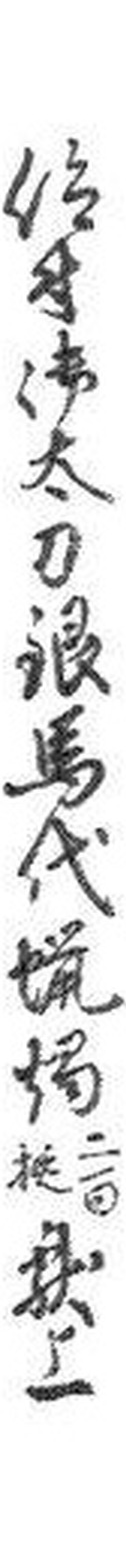仰付御太刀銀馬代蝋燭二百挺献上
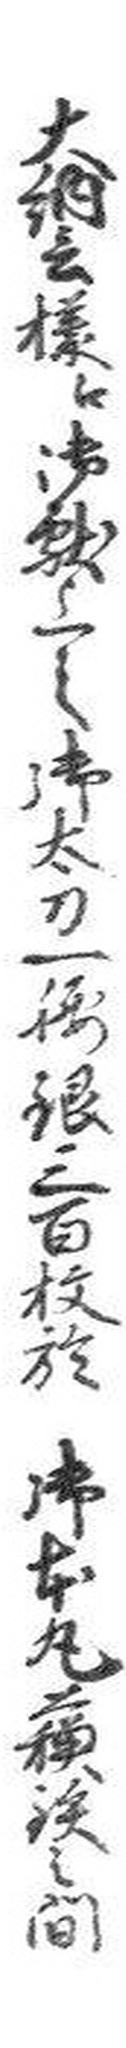大納言様江御献上之御太刀一腰銀三百枚於御本丸蘓鉄之間
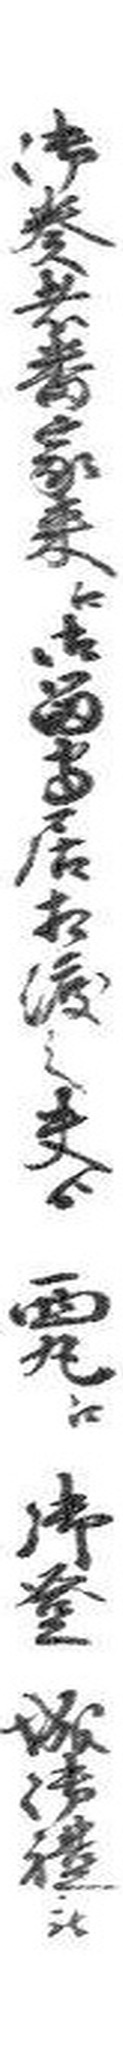御奏者番家来江御留守居相渡之夫ゟ西丸江御登城御礼被
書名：家譜 二十四 吉品公 従宝永三年到同五年
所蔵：福井県文書館 Fukui Prefectural Archives
